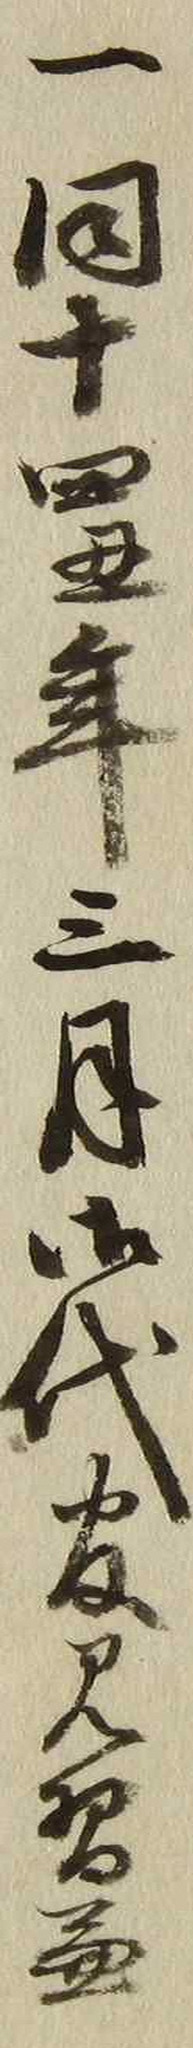一同十四丑年三月御代官見習兼
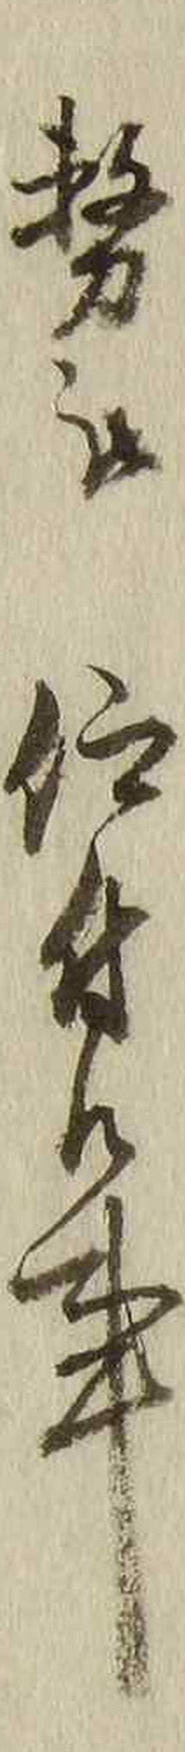務被仰付候事
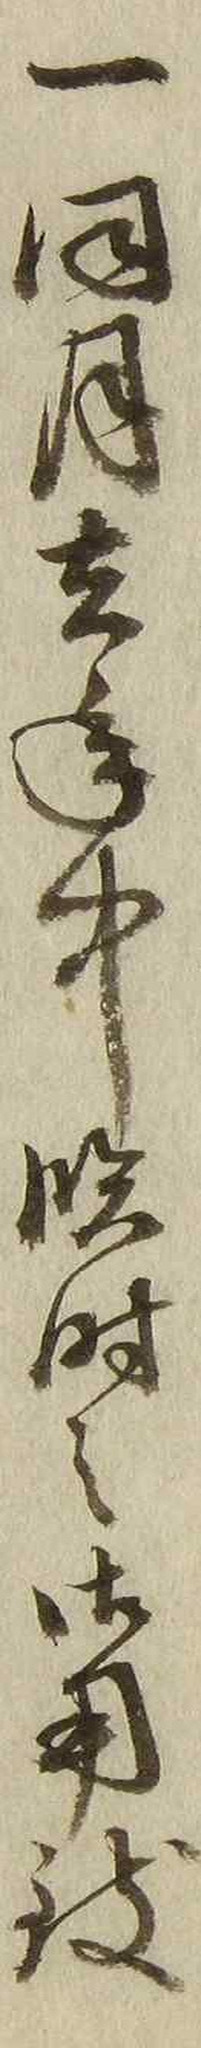一同月去年中臨時之御用致
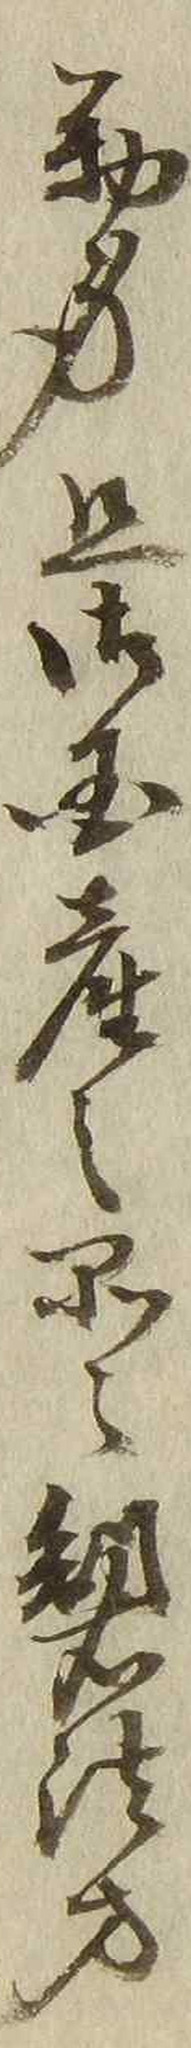勤身且御国産之品々製法方
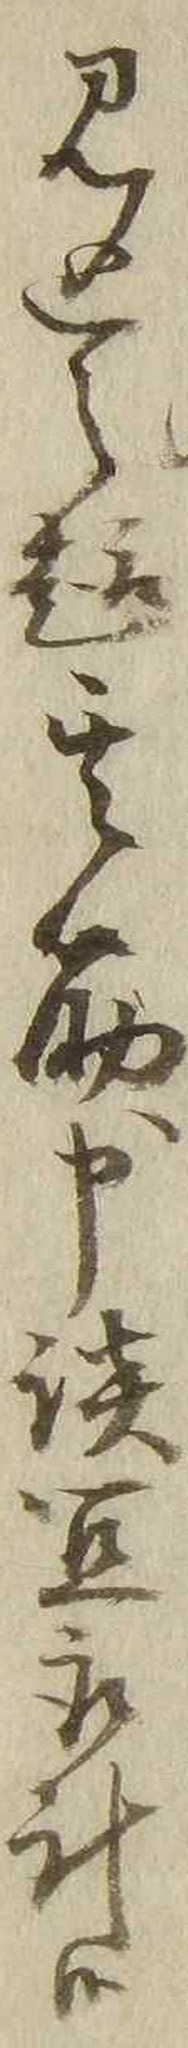見込之趣其筋ヘ申談宜取計候

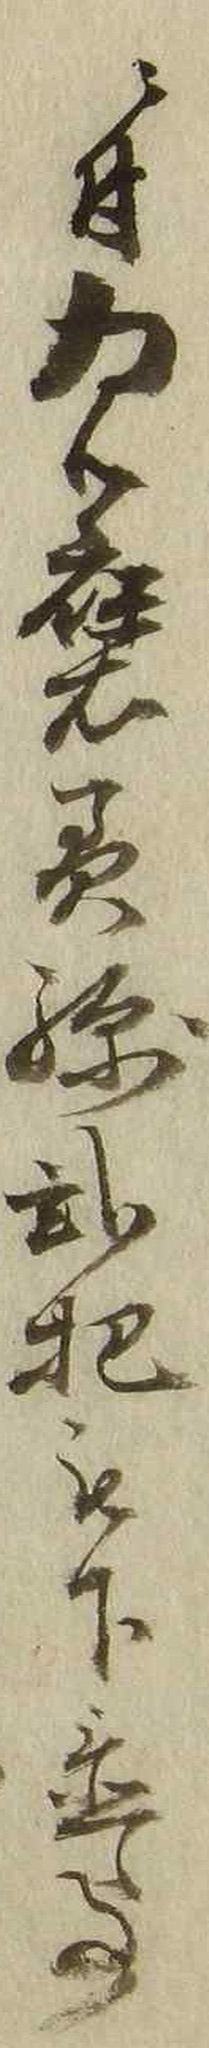ニ付為御褒美綿弐把被下置候事
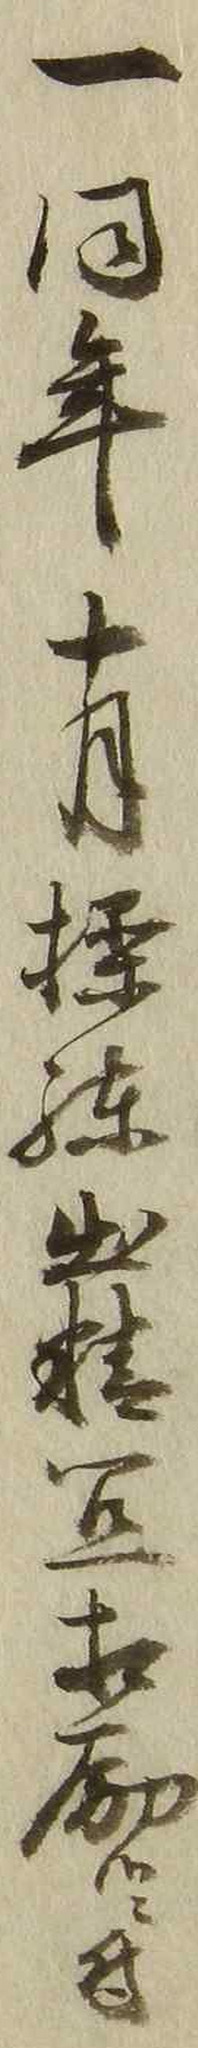一同年十月操練出精宜相勤候ニ付
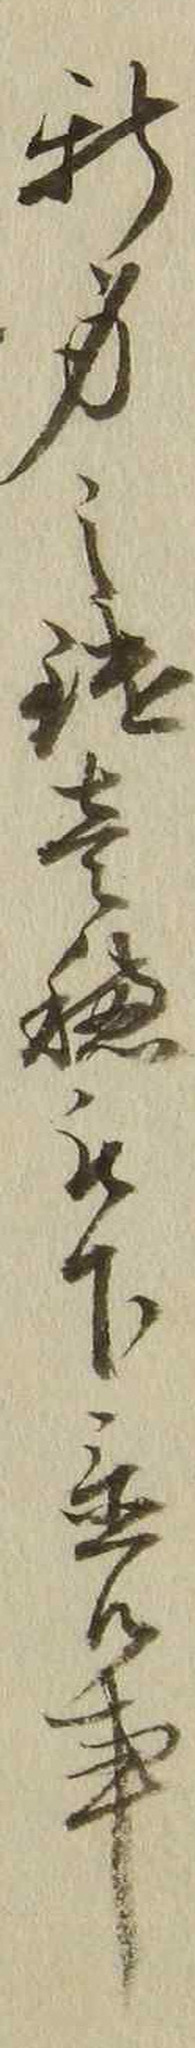新身之鑓壱穂被下置候事
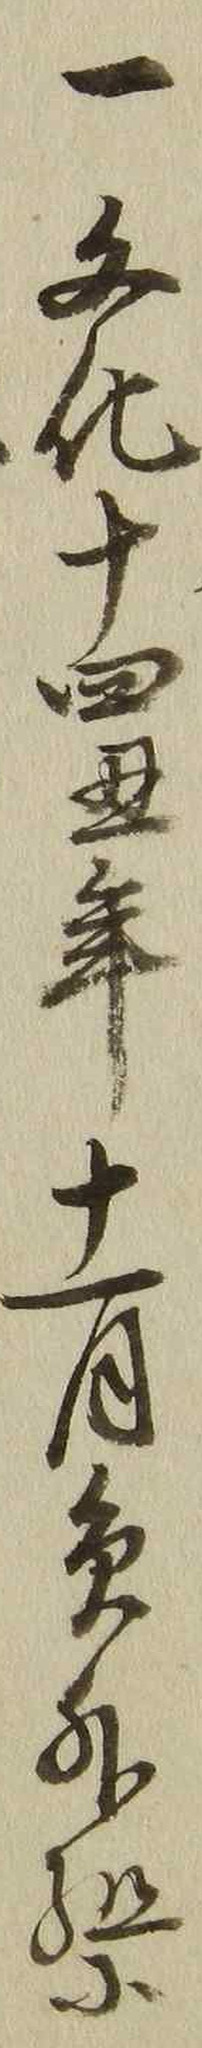一文化十四丑年十一月員外組に
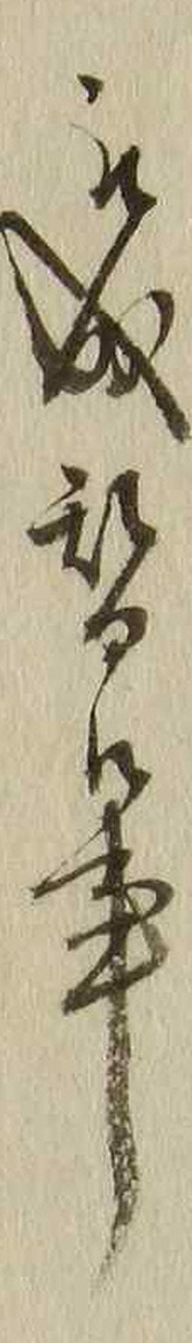被成替候事
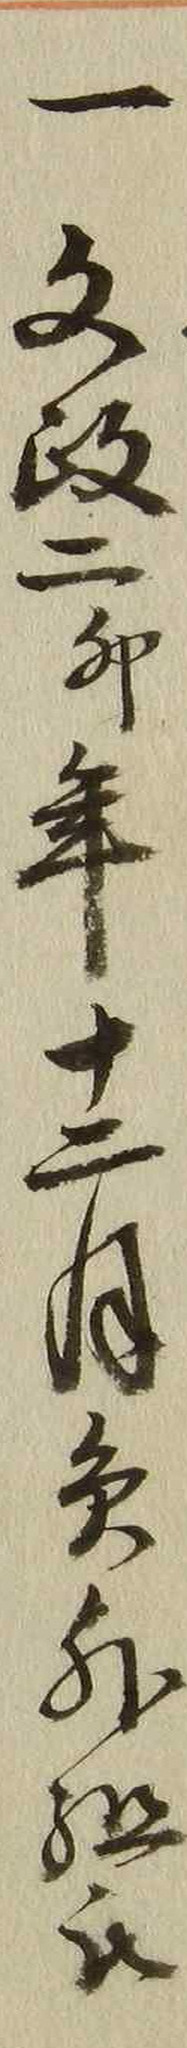一文政弐卯年十二月員外組被
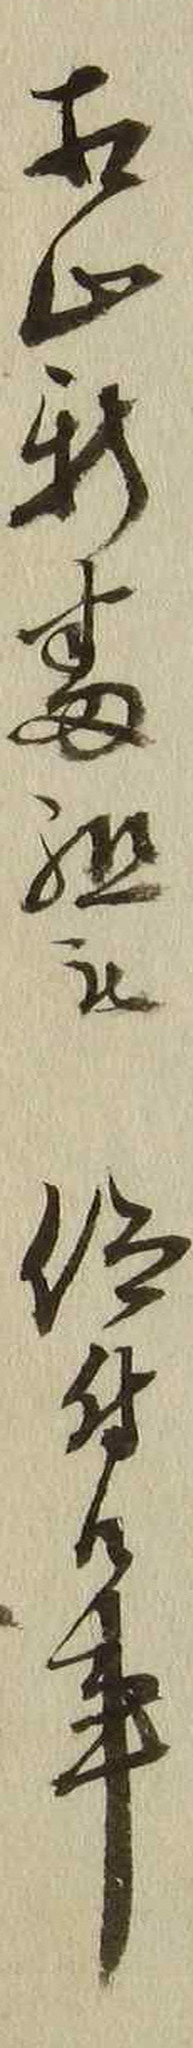相止新番組被仰付候事
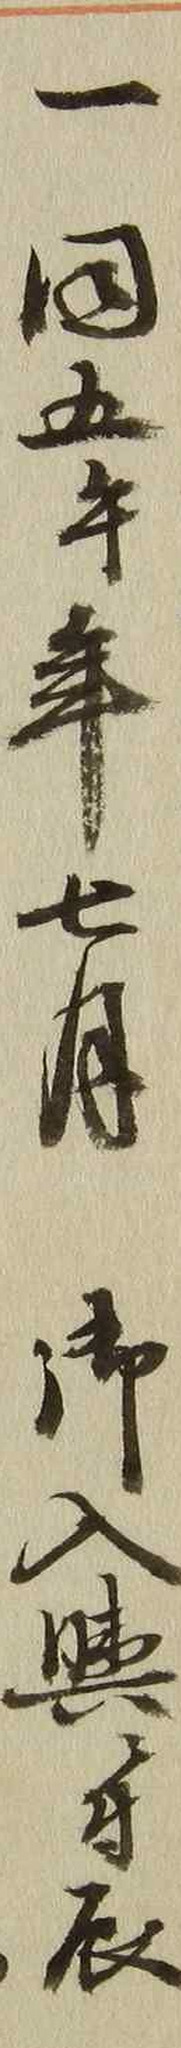一同五午年七月御入輿ニ付辰
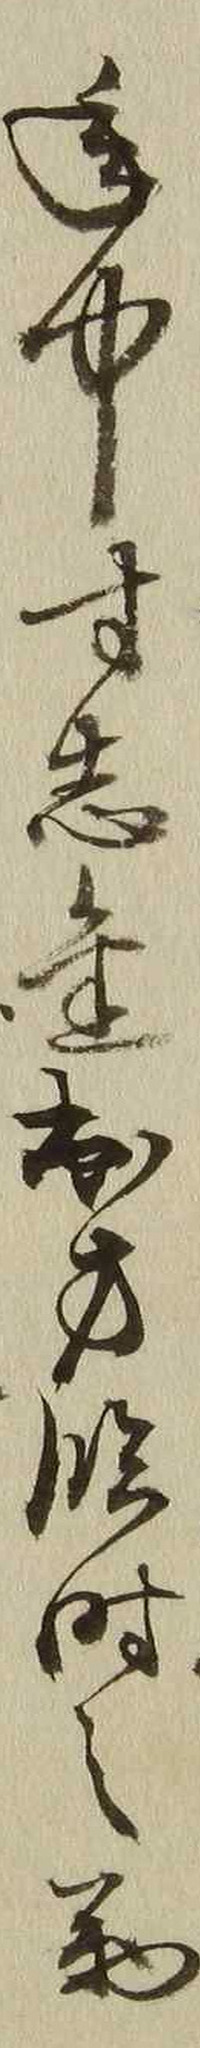年中寸志金出方臨時之勤
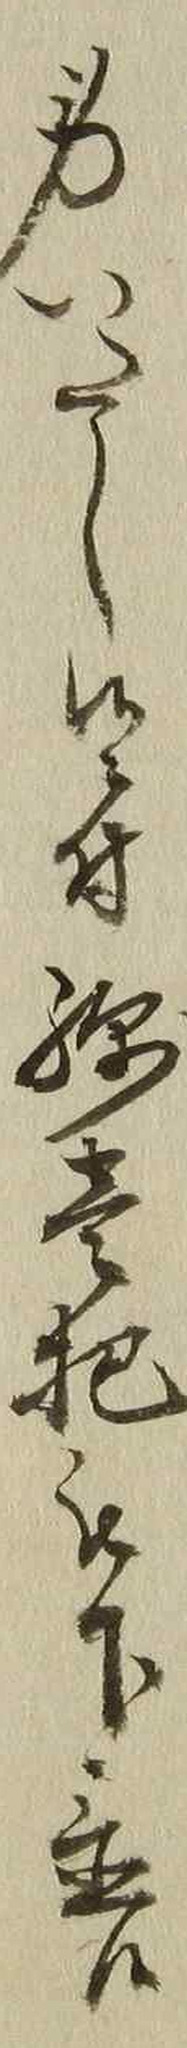身いたし候ニ付綿壱把被下置候
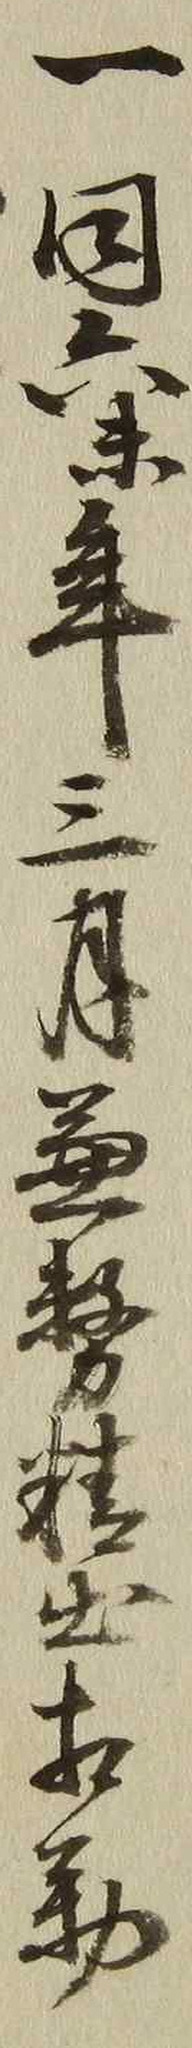一同六未年三月兼務精出相勤
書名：諸士系譜　巻之64　と之部7
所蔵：会津若松市立会津図書館
